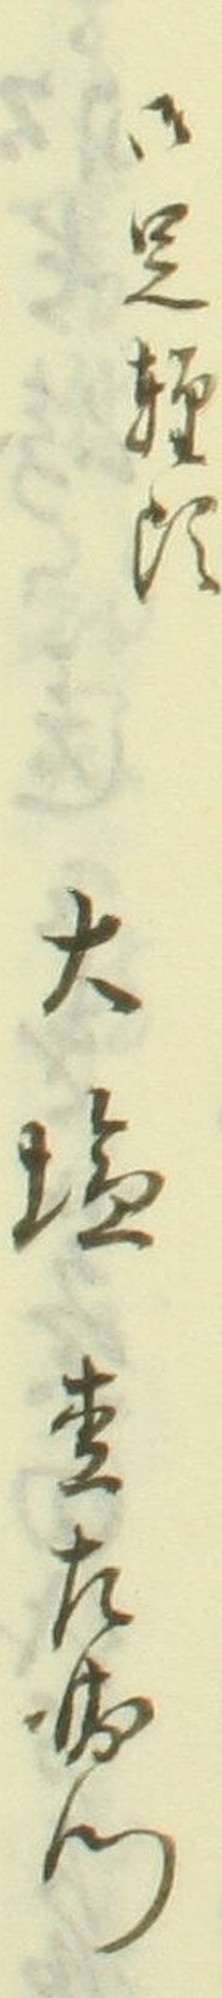大塩杢左衛門
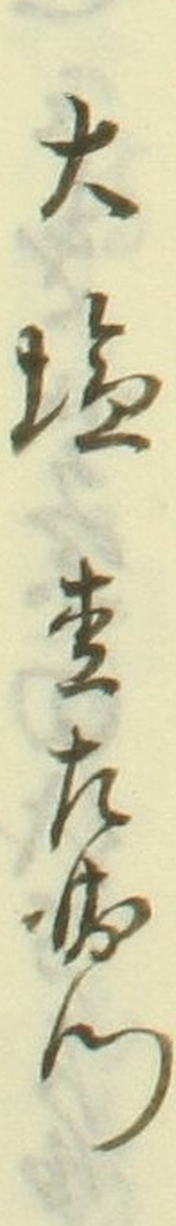大塩杢左衛門
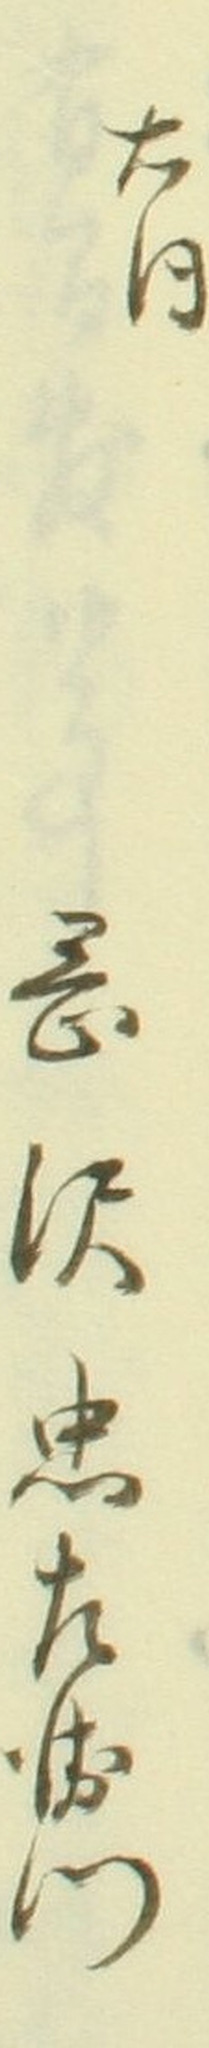岡沢忠左衛門
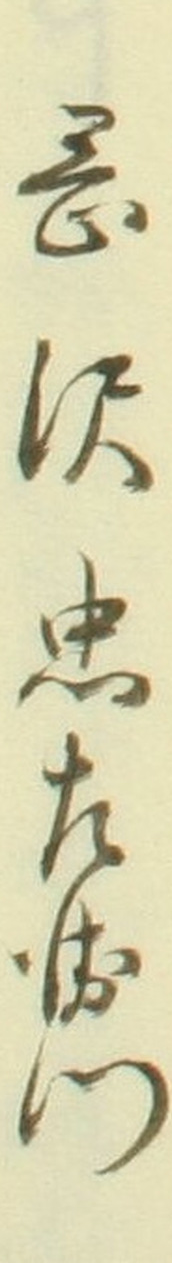岡沢忠左衛門
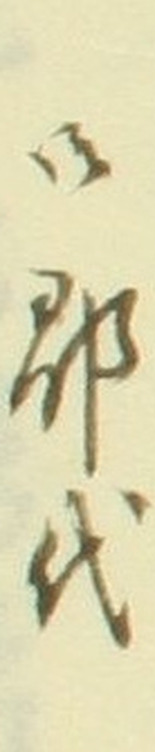御郡代
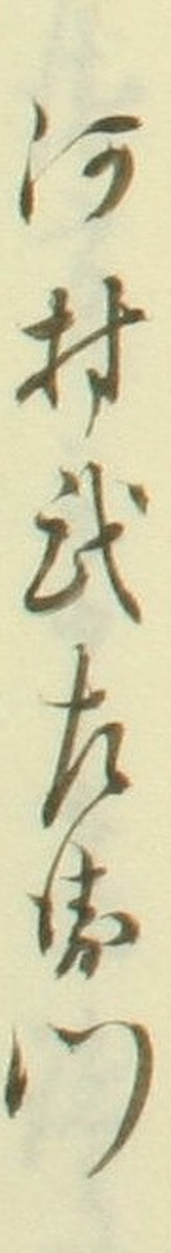河村武左衛門

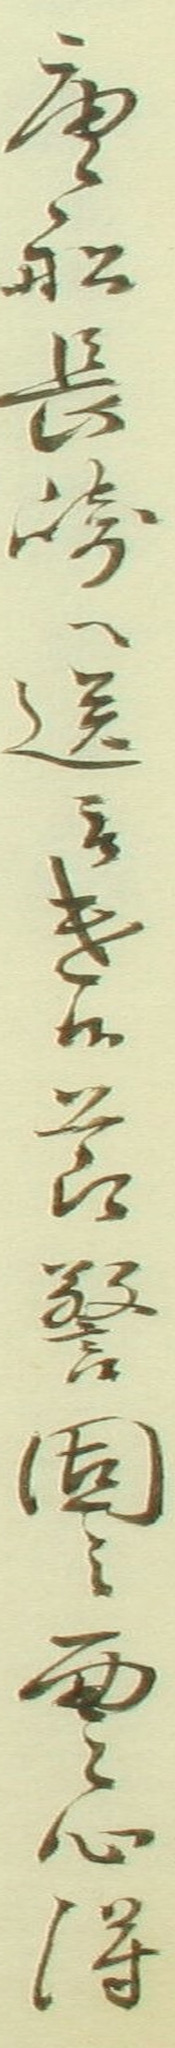唐船長崎へ送被遣候節警固之面々心得
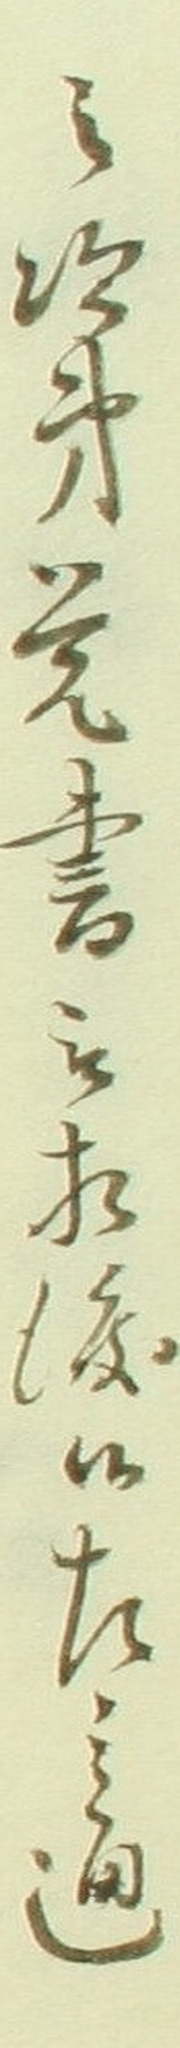之次第覚書被相渡候左之通
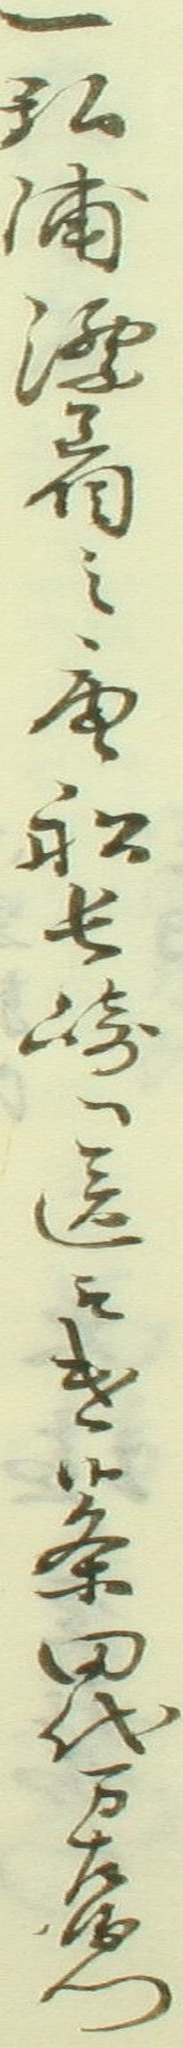一弘浦漂着之唐船長崎へ送被遣候条田代万左衛門
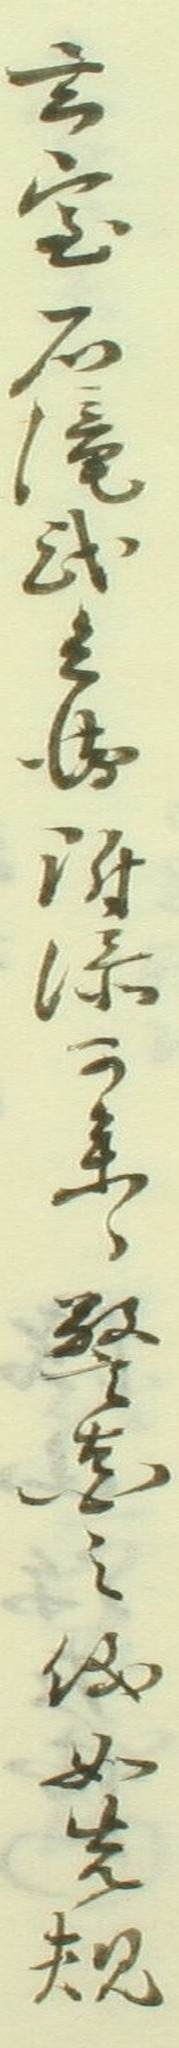玄宝石滝武兵衛附添可参候警固之儀如先規
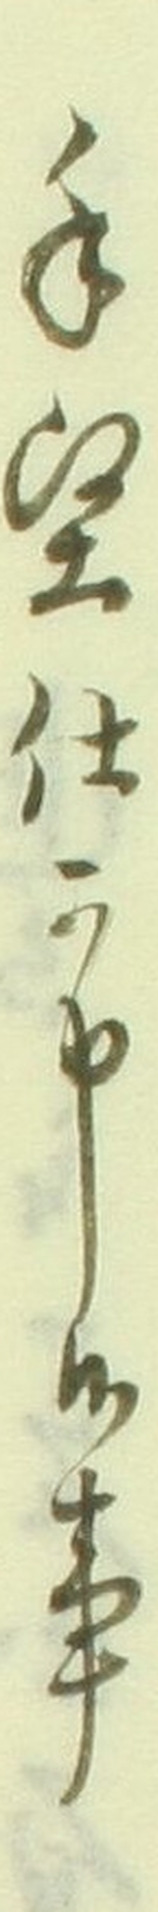手堅仕可申候事
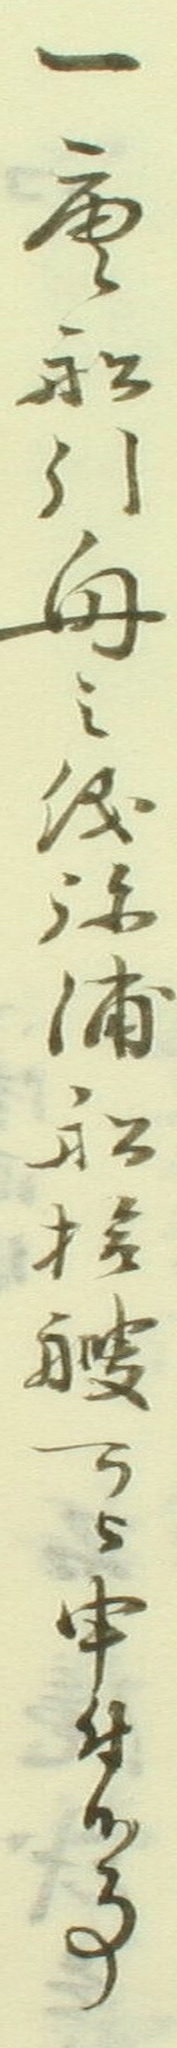一唐船引舟之儀弥浦船拾艘可被申付候事
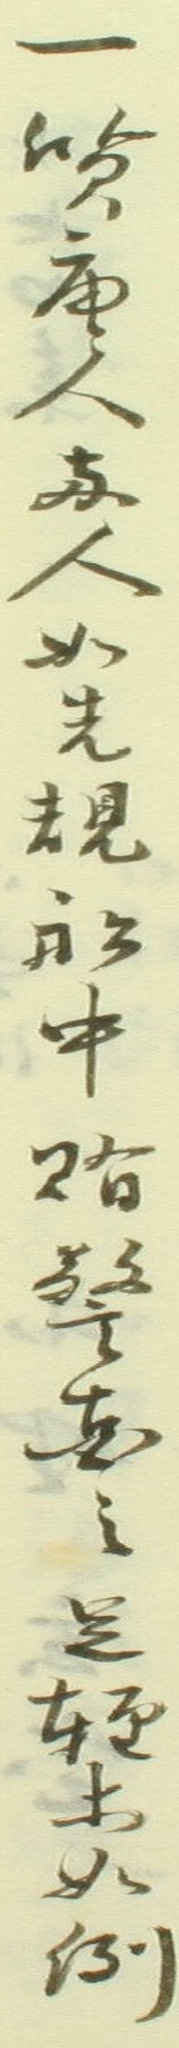一質唐人両人如先規船中賄警固之足軽等如例
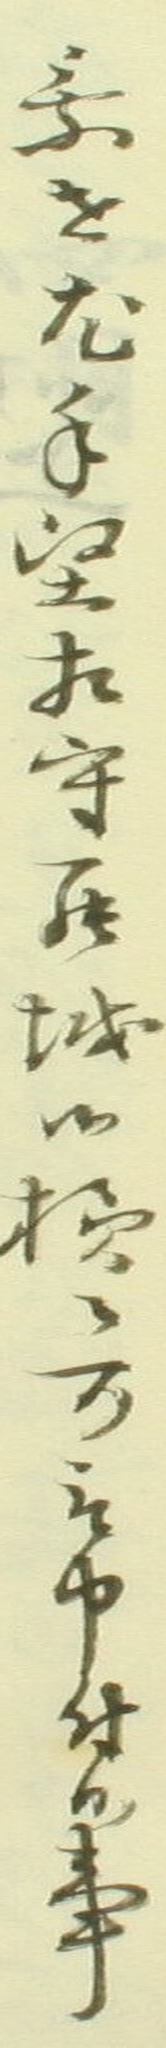乗せ尤手堅相守罷越候様に万被申付候事
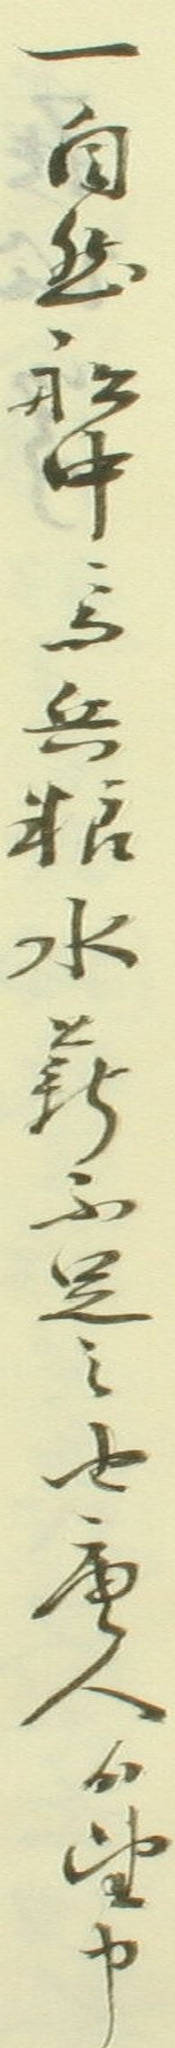一自然船中に而兵粮水薪不足之由唐ゟ望申
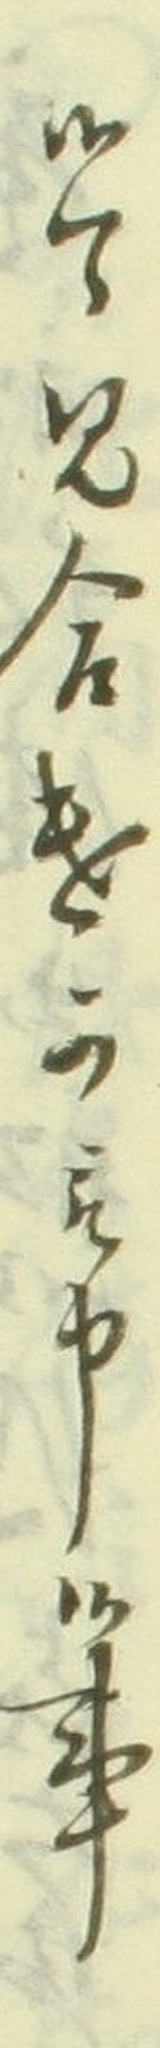候て見合遣可被申候事
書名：異国船漂着記
